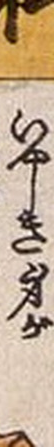いやしき身が
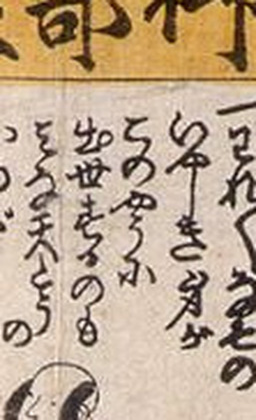このやうに
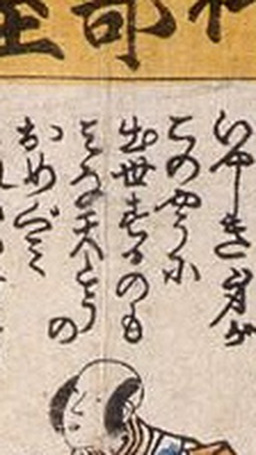出世するのも
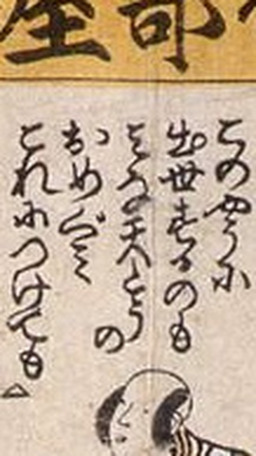みな天とうの
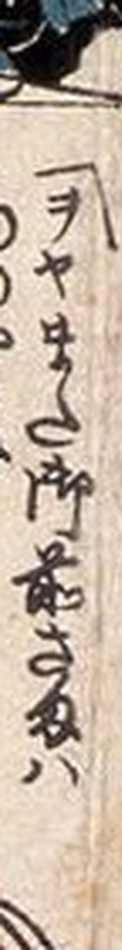〽ヲヤまた御前さまは
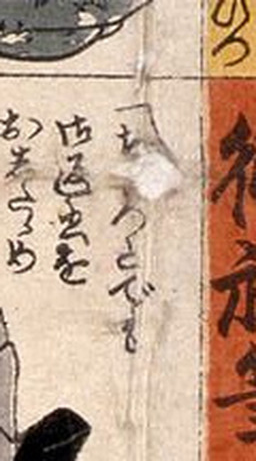〽ちよつとでも
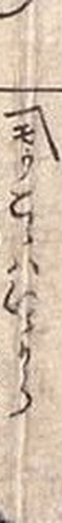〽モウここはいいから
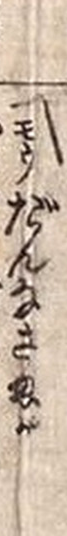〽モウだんなさまが
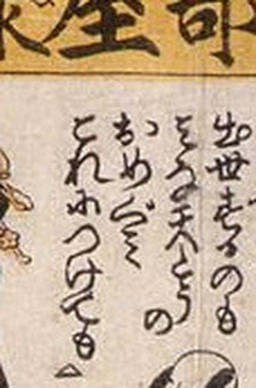おめぐみ
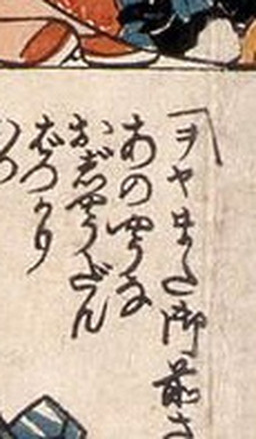あのやうな
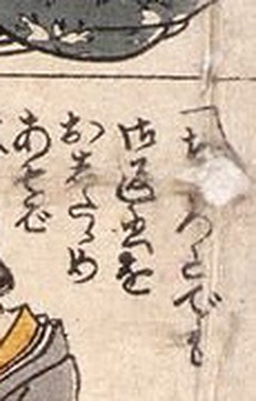御返書を
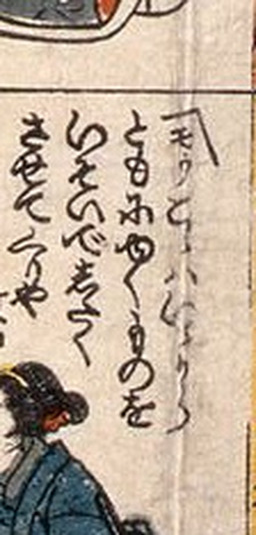ともにゆくものを
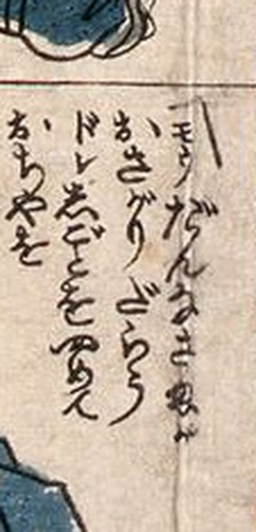おさがりだらう
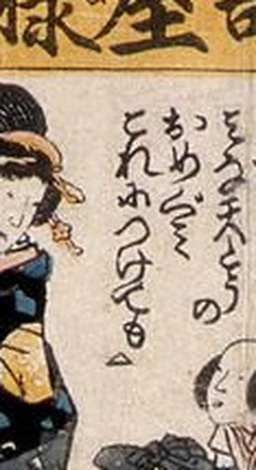これにつけても△
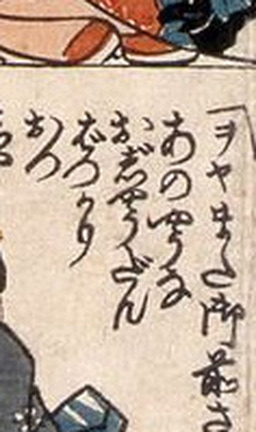おじやうだん
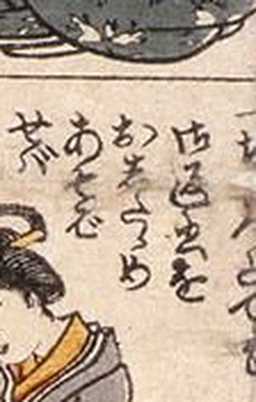おしたヽめ
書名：奥奉公出世双六
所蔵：東京学芸大学教育コンテンツアーカイブ
